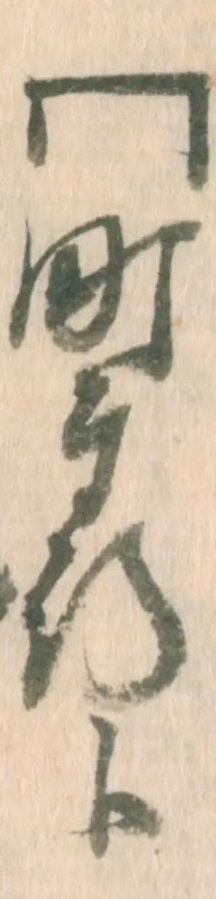│[町奉行え
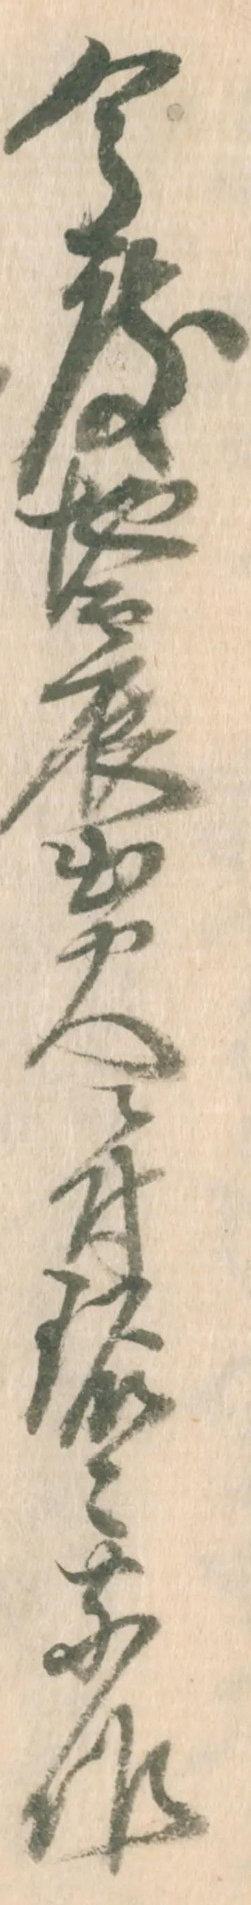今度地震出火ニ付銘〻家作
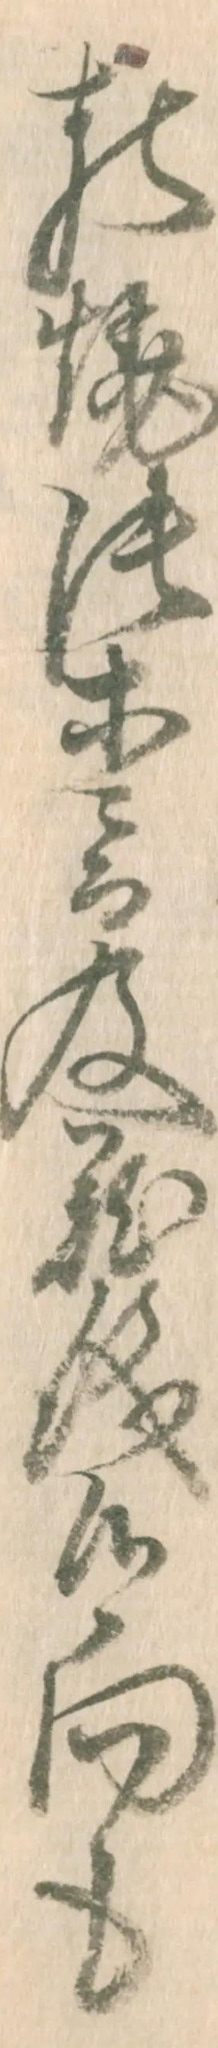類焼潰等ニて及難儀候向も
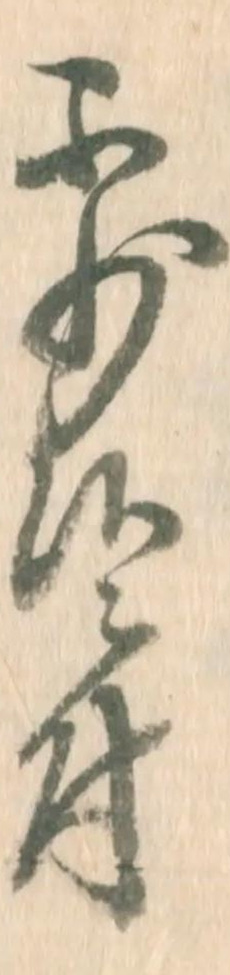不少候ニ付

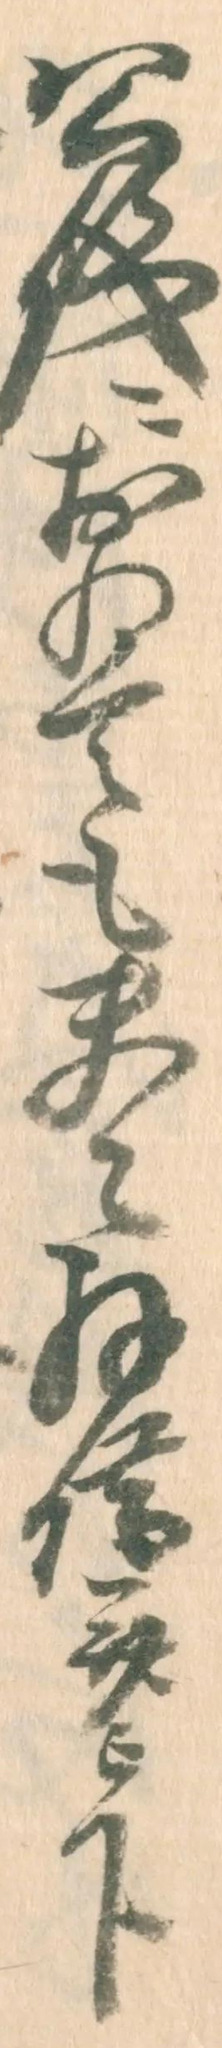公儀ニおいても夫〻拝借幷被下
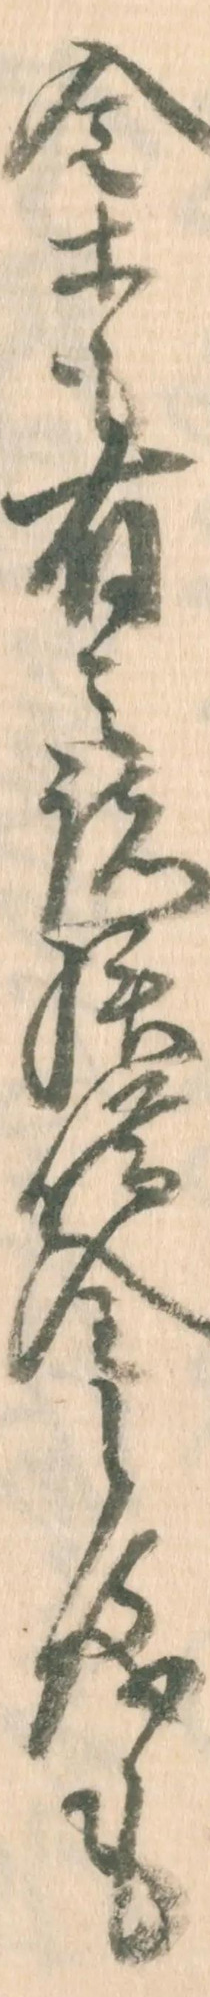金等も有之諸拝借金之儀も
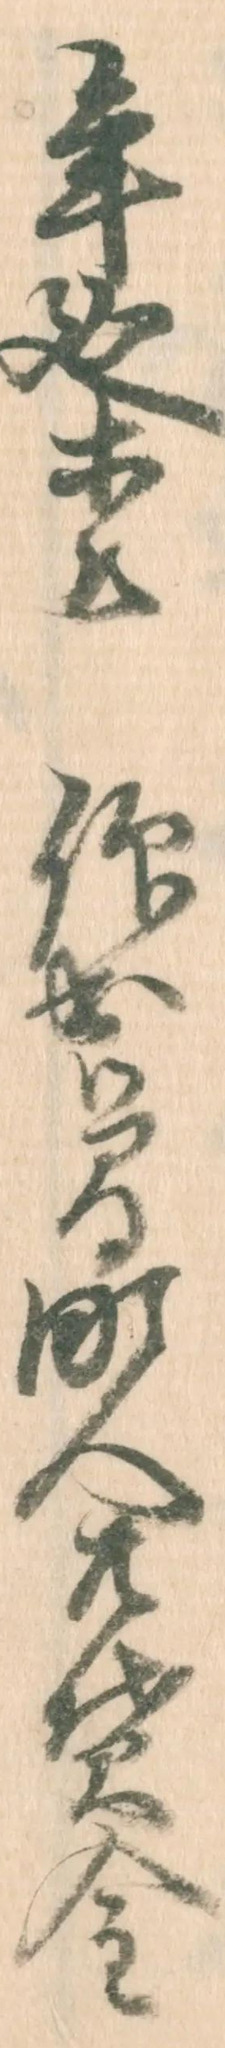年延等被仰出候間町人共貸金
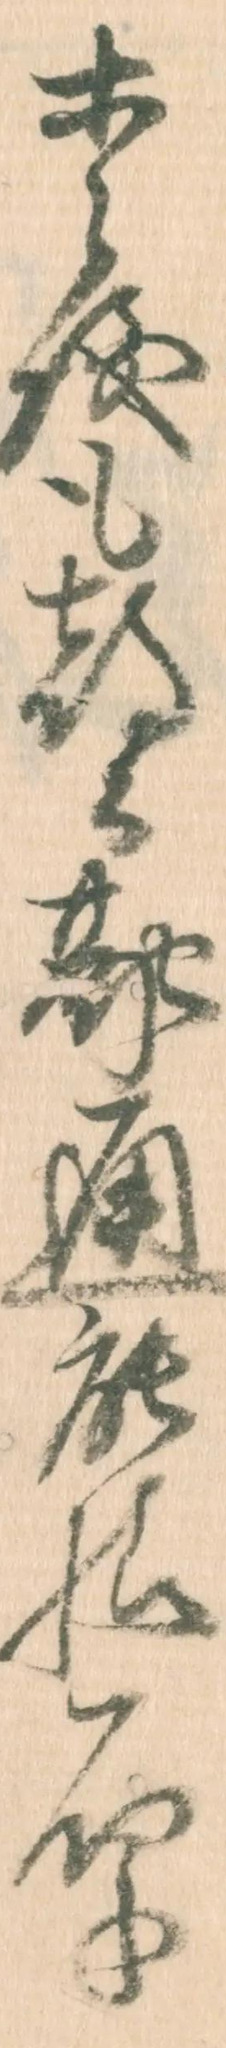等之儀も都て融通能様厚
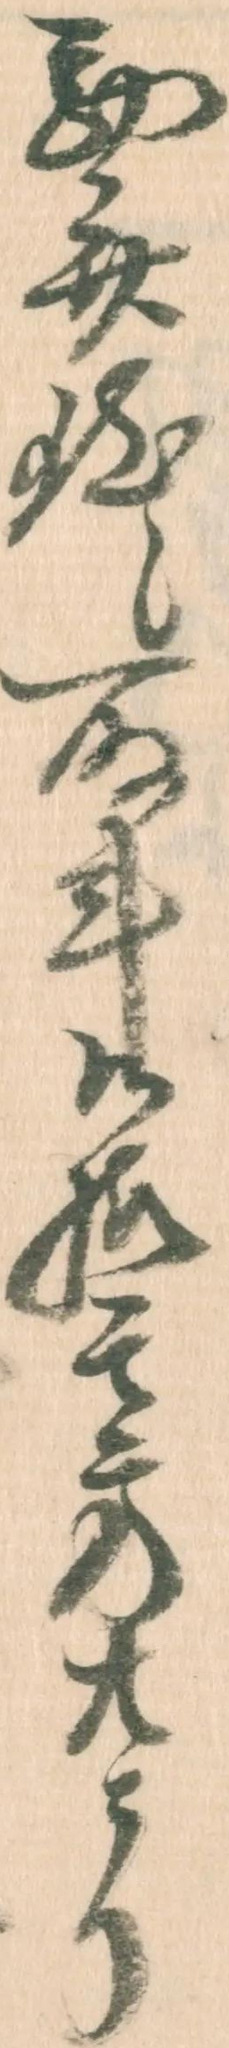勘弁致し取計候様其方共より
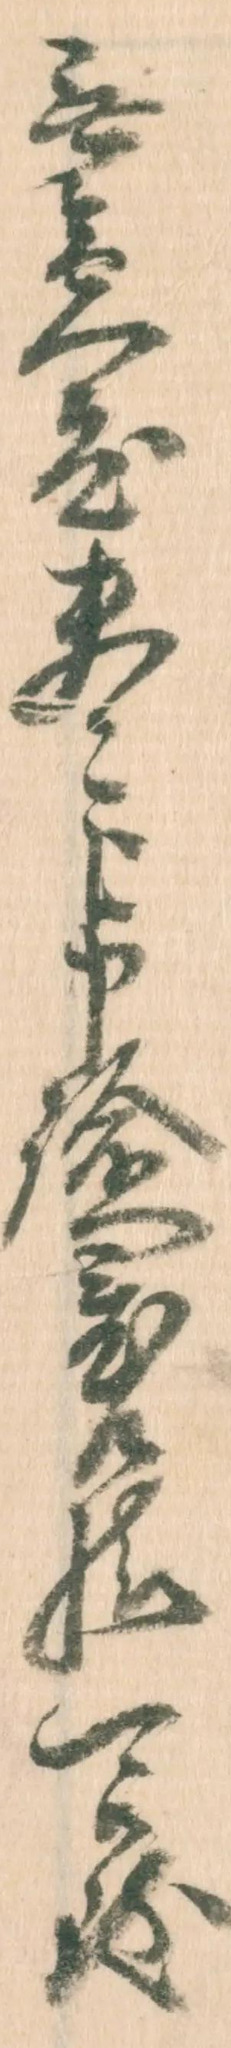無急度夫〻え申諭置候様可被致
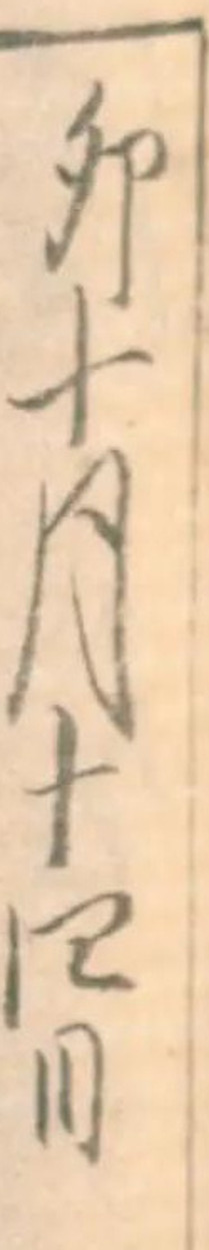│卯十月十四日
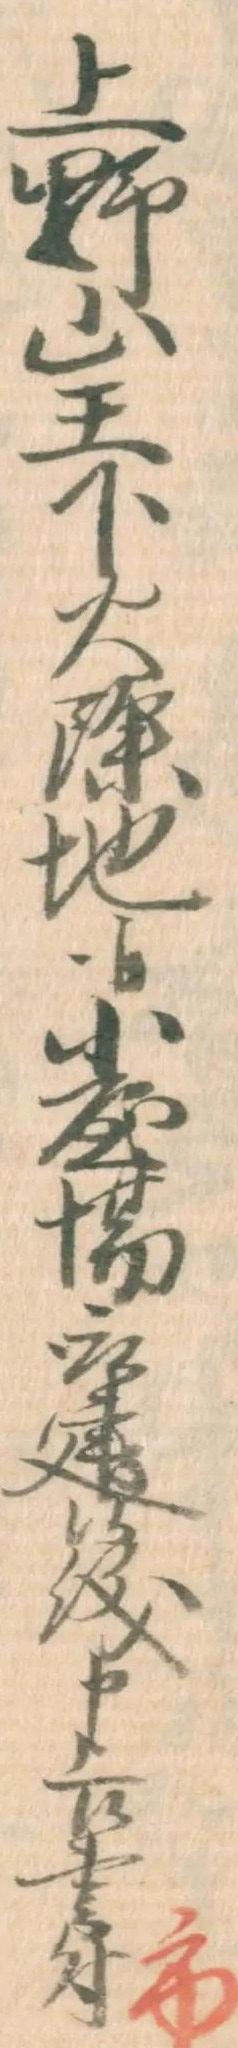│上野山王下火除地え小屋場取建候儀申上候書付
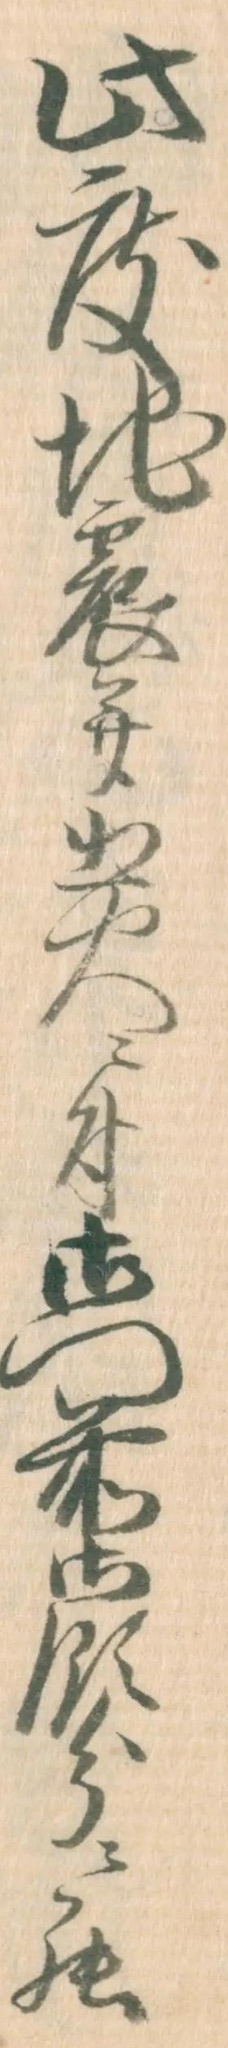此度地震幷出火ニ付御門前御領分ニ罷
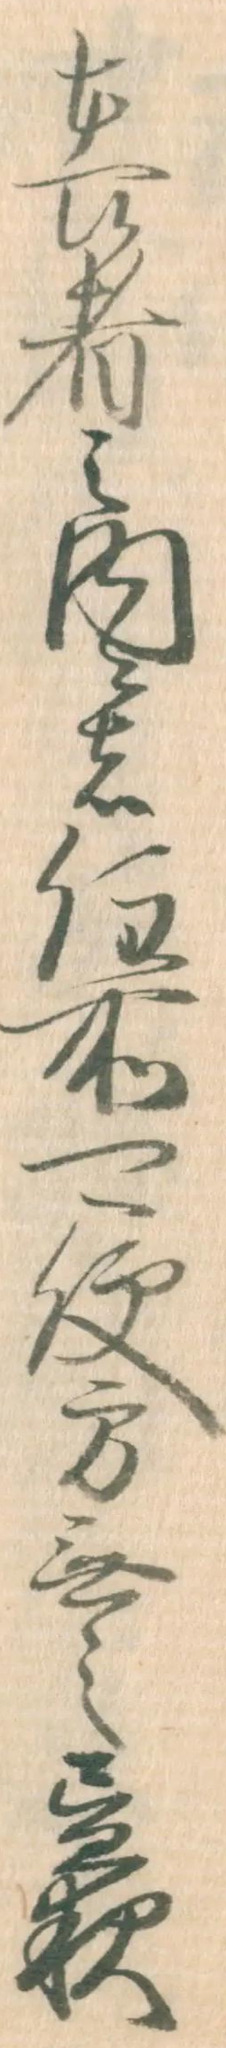在候者之内ニは住所可便方無之昼夜
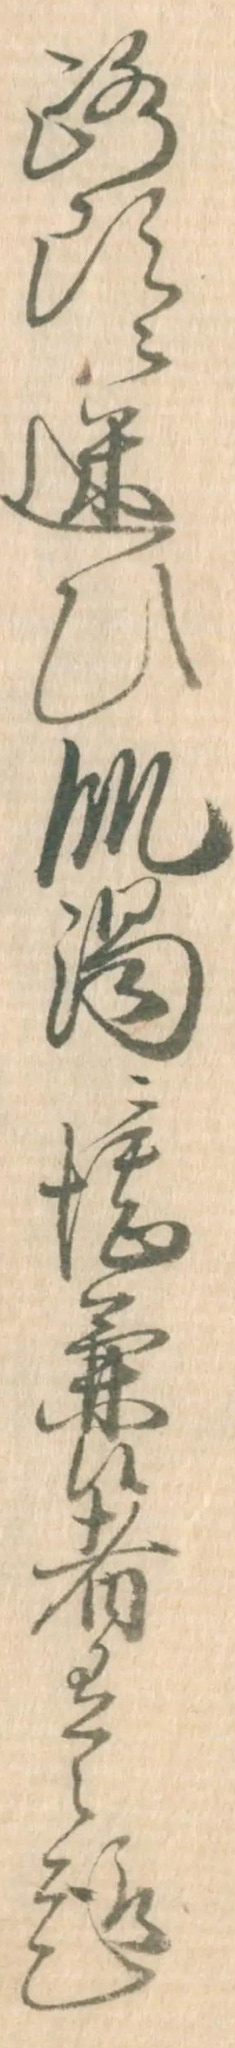路頭ニ迷ひ飢渇ニ堪兼候者有之趣

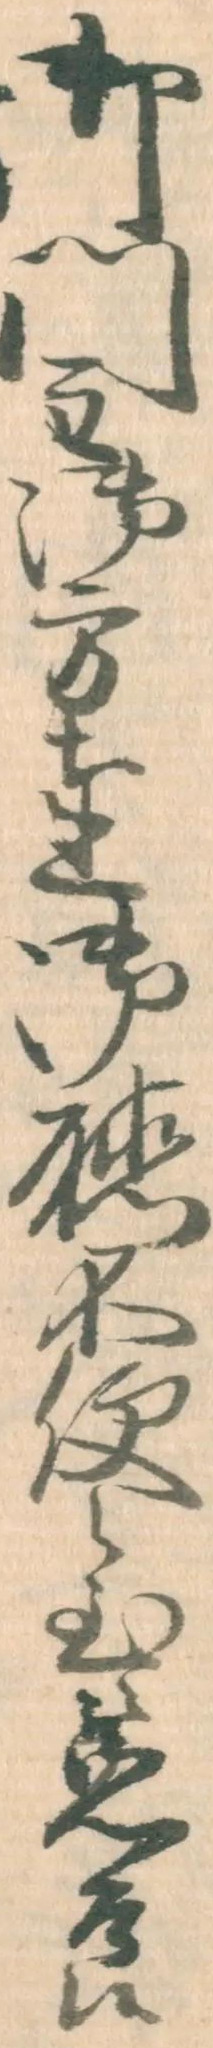御門主御方達御聴不便之至ニ被思召候
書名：地震災書留 2巻. [2] 内表紙に「地震一件　安政二卯年十月」とあり
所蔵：国立国会図書館 National Diet Library, JAPAN
